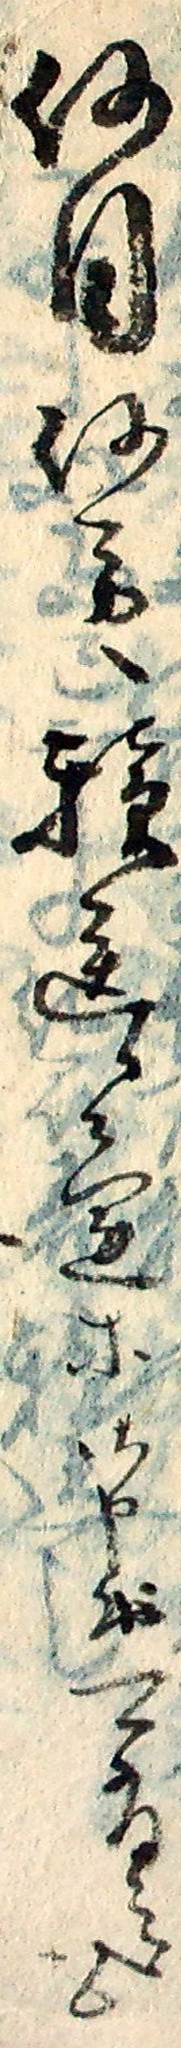何月何方へ積送り候運等御申出可有之候以上
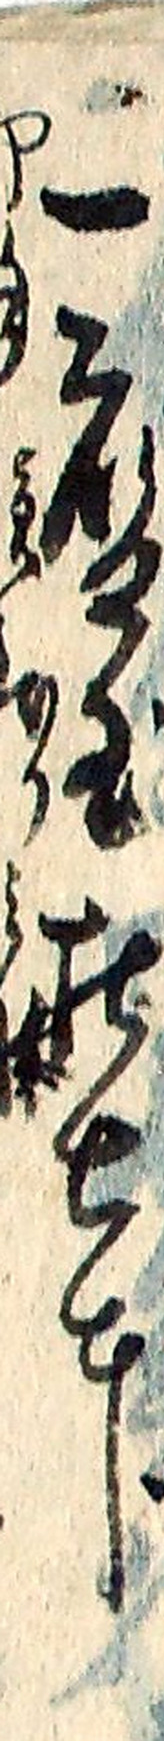一藍玉廿七本

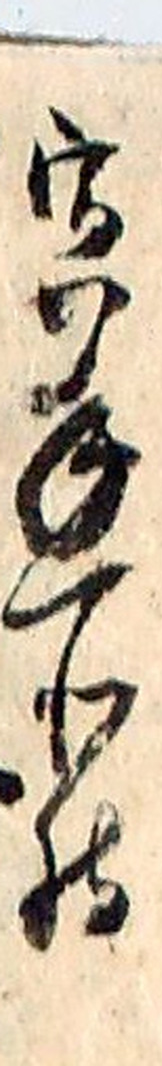寅年所持
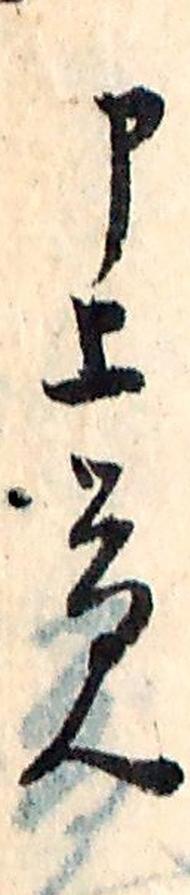申上覚
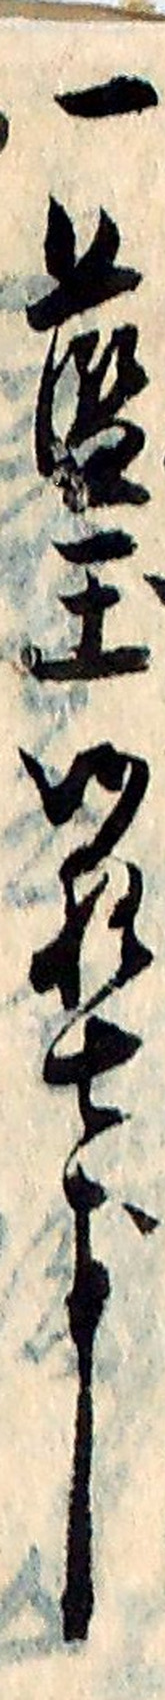一藍玉弐拾七本
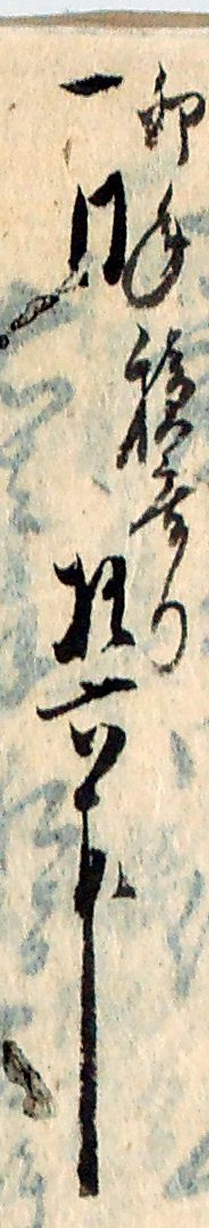一同拾六本
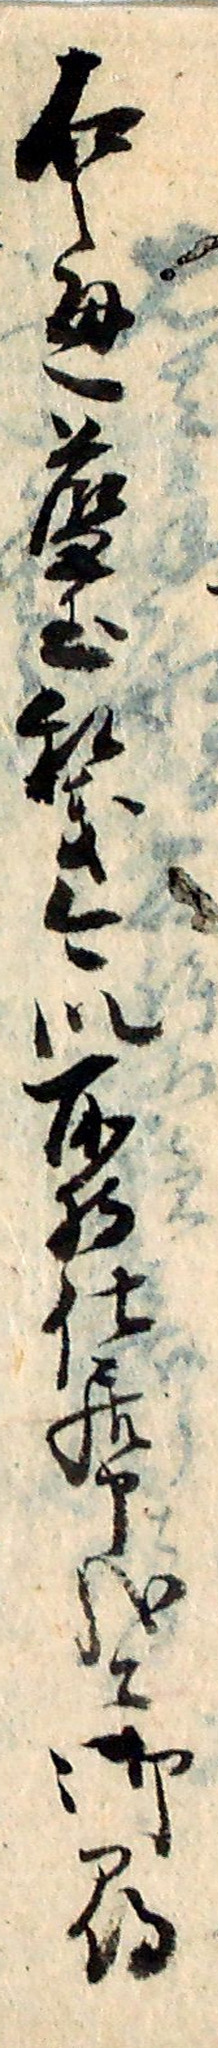右之通藍玉私義今以所持仕居申哉と御尋
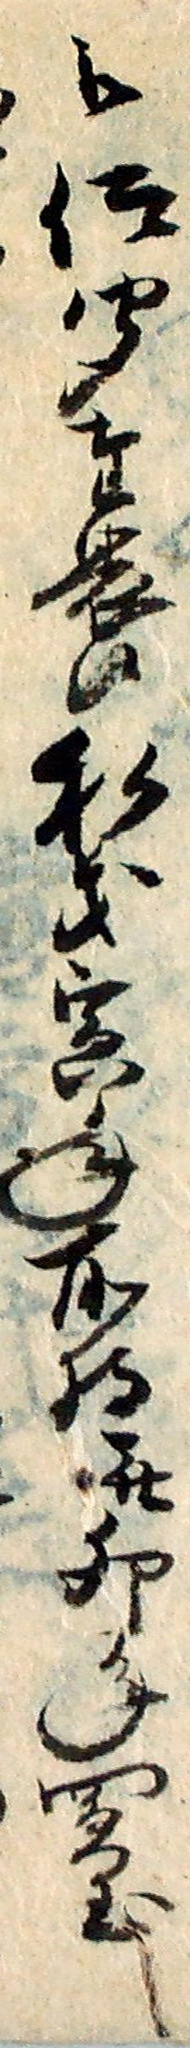被仰付奉畏候私義寅年所持并卯年買玉
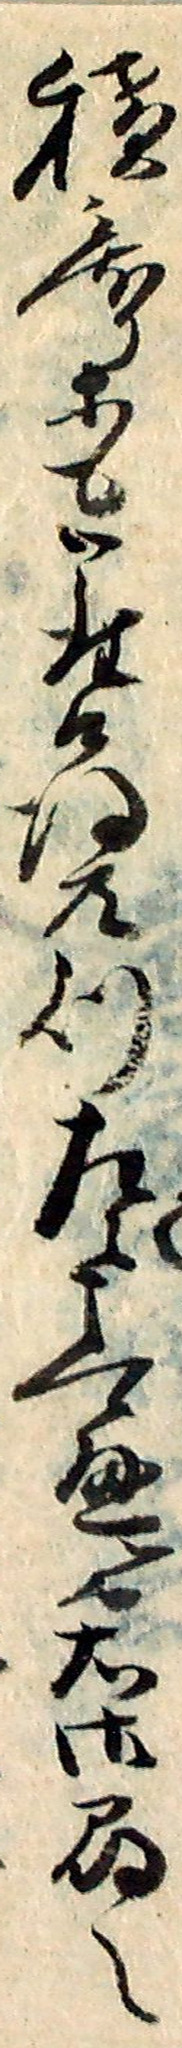積戻り等も御座候得共則左に申上候通にて右御尋之
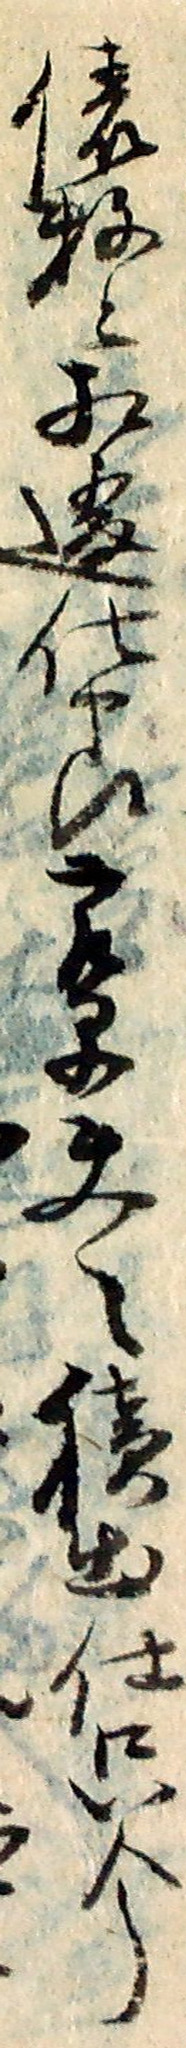俵数と相違仕申候最早夫々積出仕只今
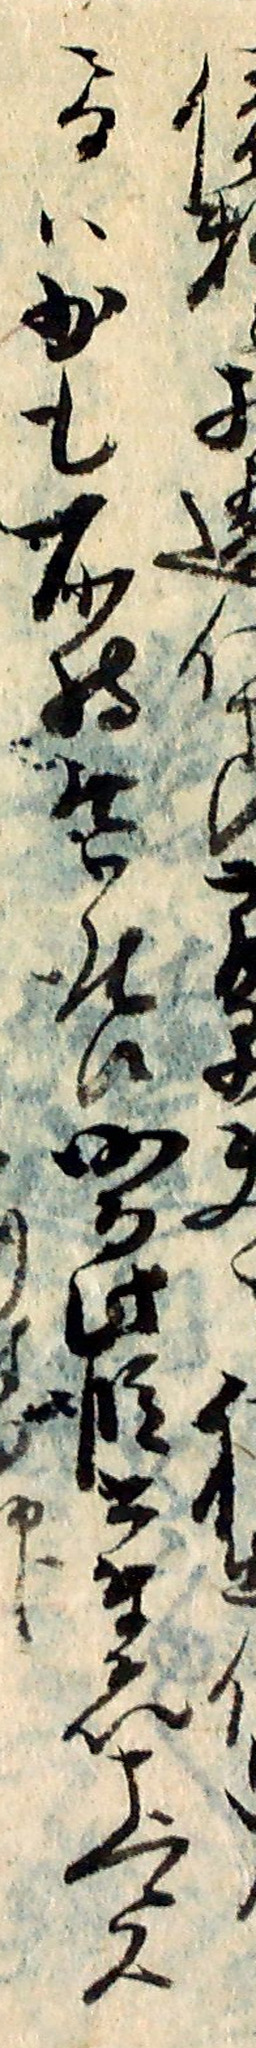にては少も所持無御座候仍て此段書付を以申上候以上
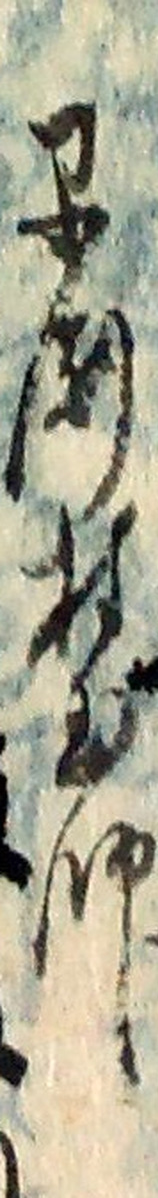早淵村玉師
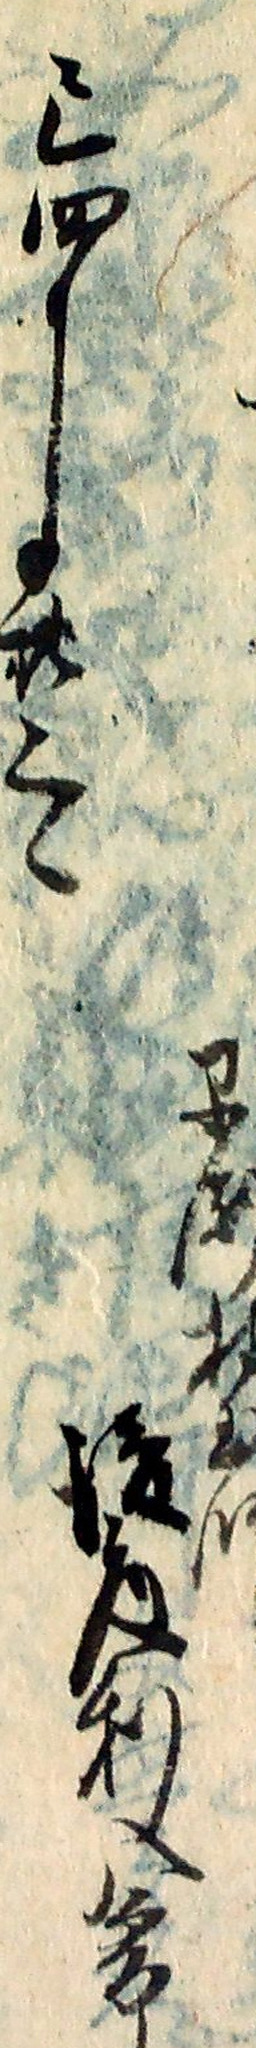巳四月廿二日後藤利八郎
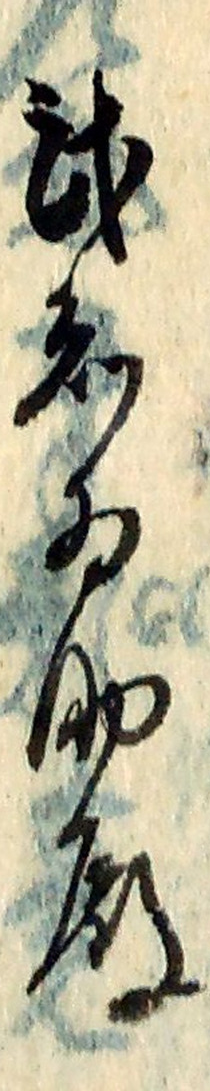武知為助殿
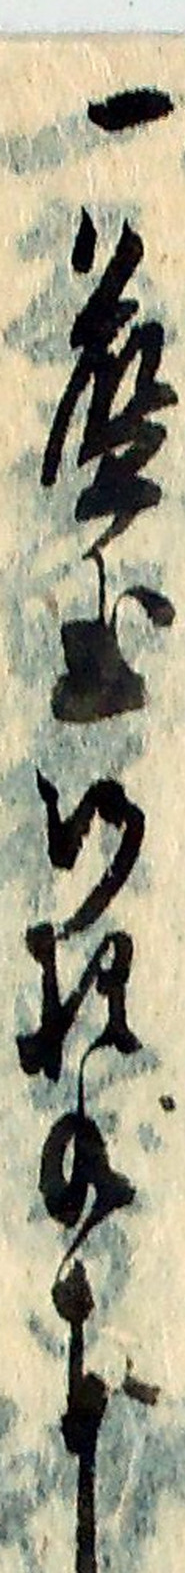一藍玉弐拾七本
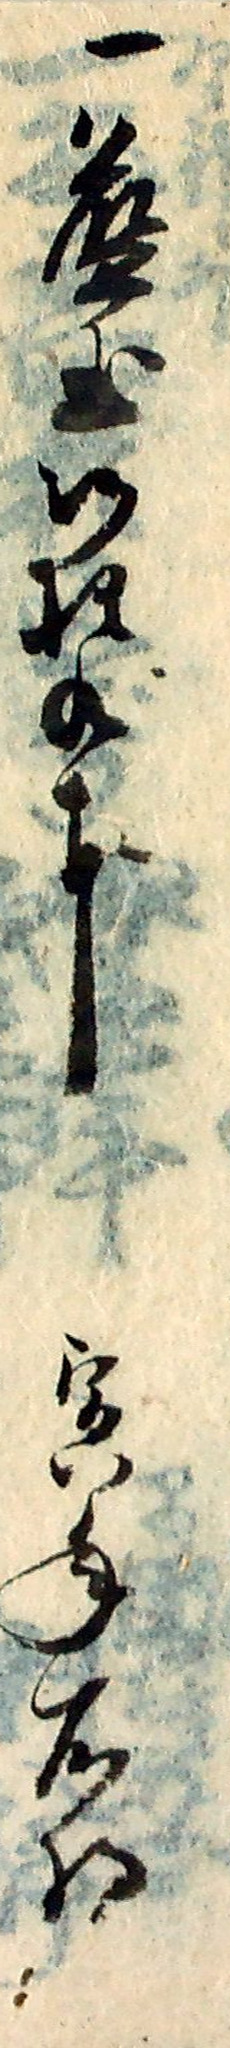一藍玉弐拾九本寅年所持
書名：諸御願書控(後藤氏壱番）
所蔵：鳴門教育大学 Naruto University of Education
